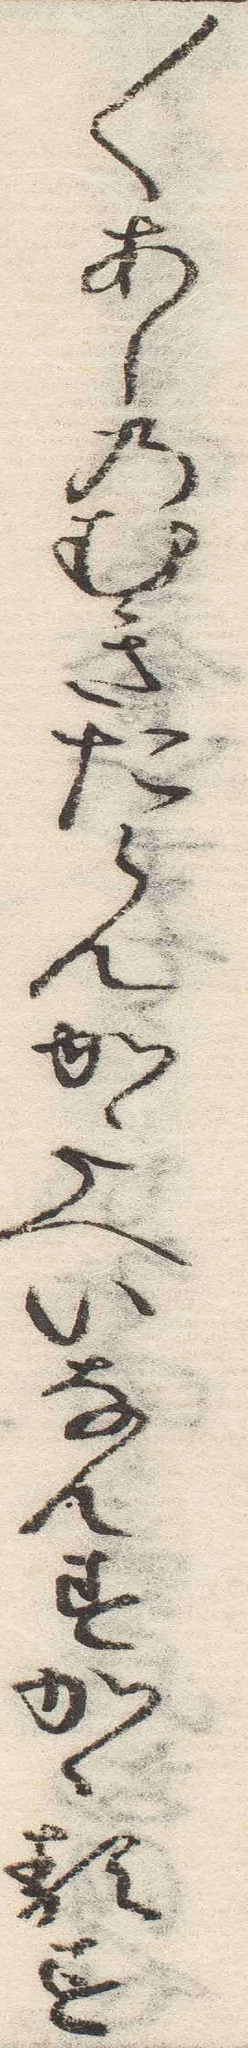〳〵あしのむきたらんかたへいなんすかゝるす
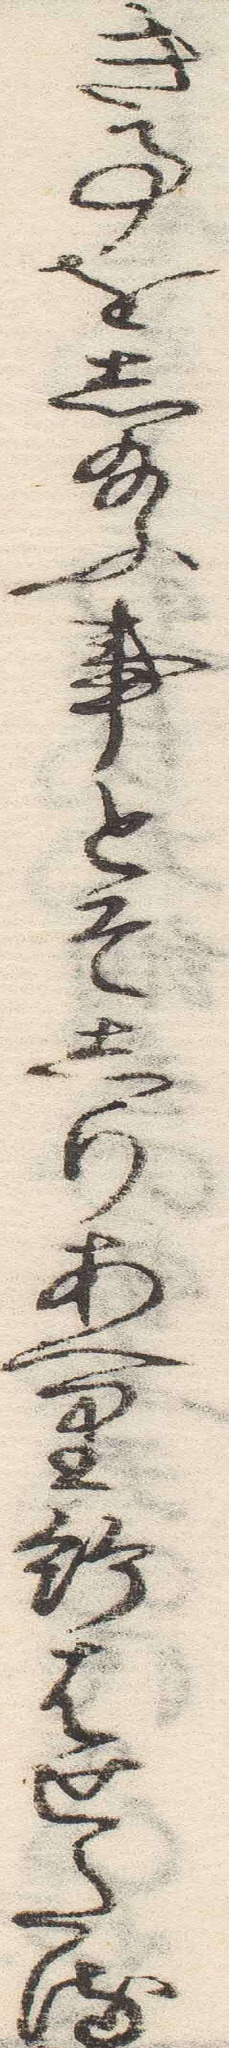き事をし給ふ事とそしりあへり給はせたる
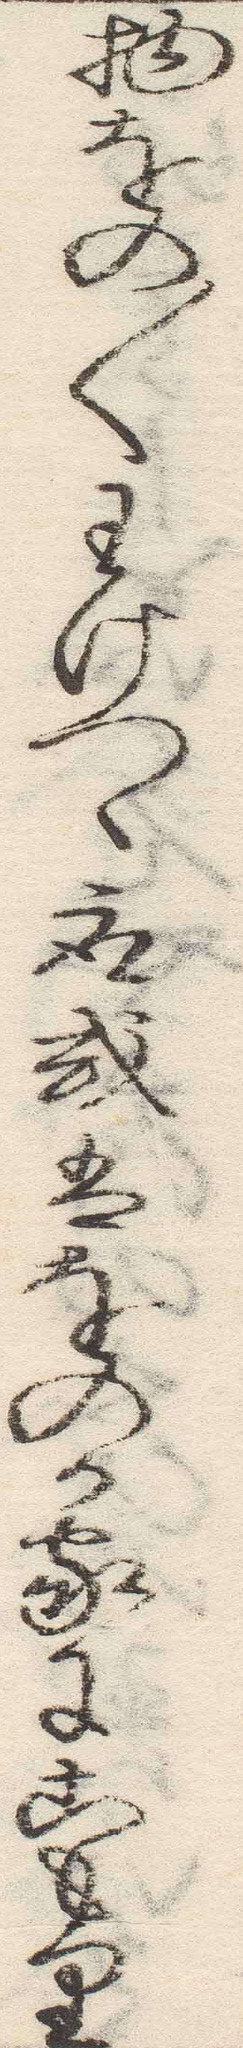物をの〳〵わけつゝ取或はをのか家にこもり
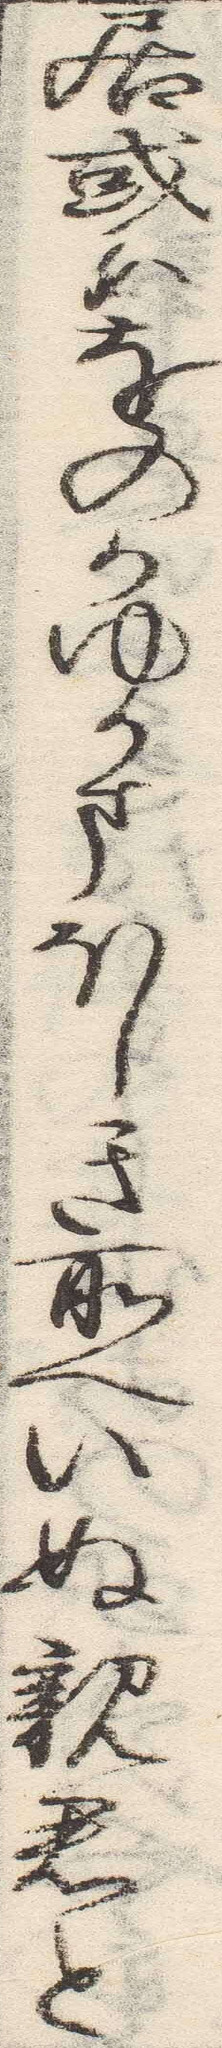居或はをのかゆかまほしき所へいぬ親君と
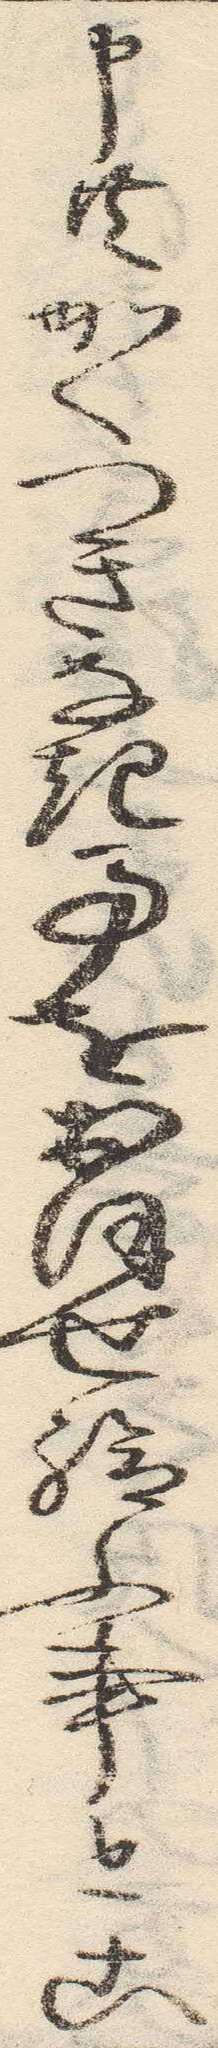申共かくつきなき事をおほせ給ふ事とこ
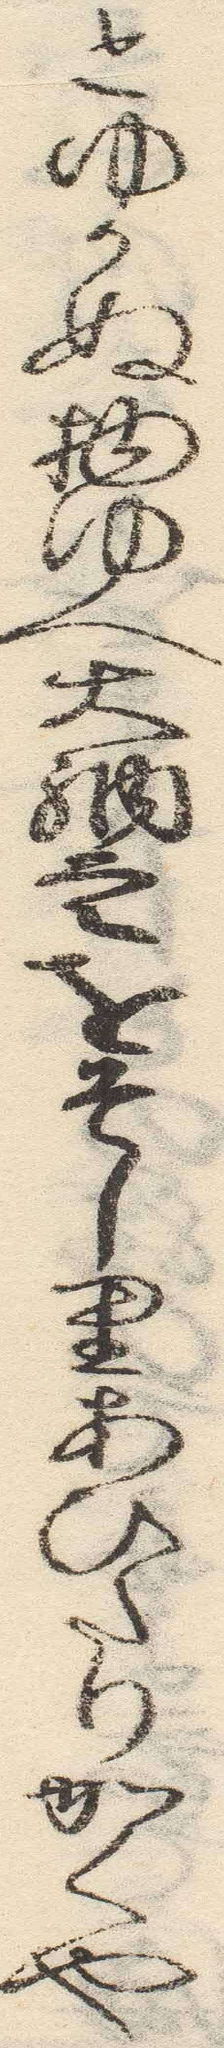とゆかぬ物ゆへ大納言をそしりあひたりかくや
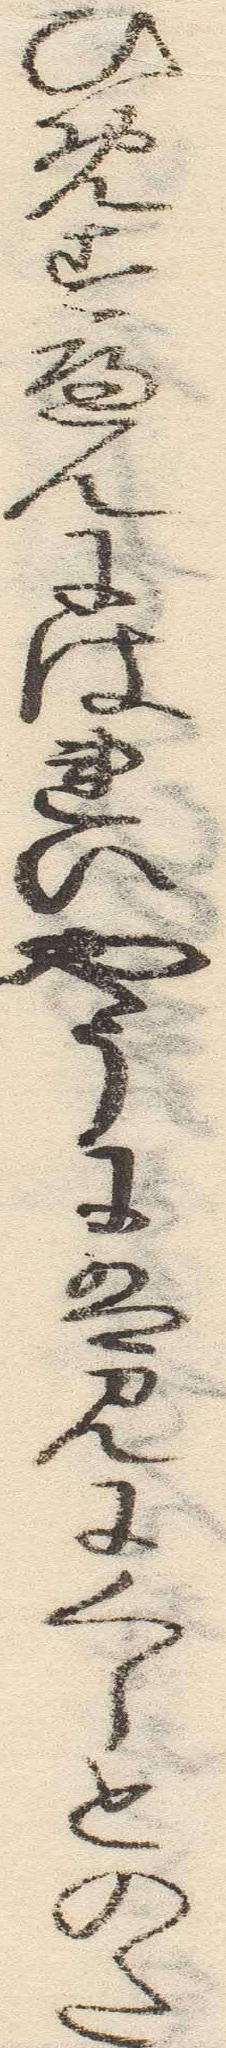ひめすへんにはれいやうにはみにくしとのた
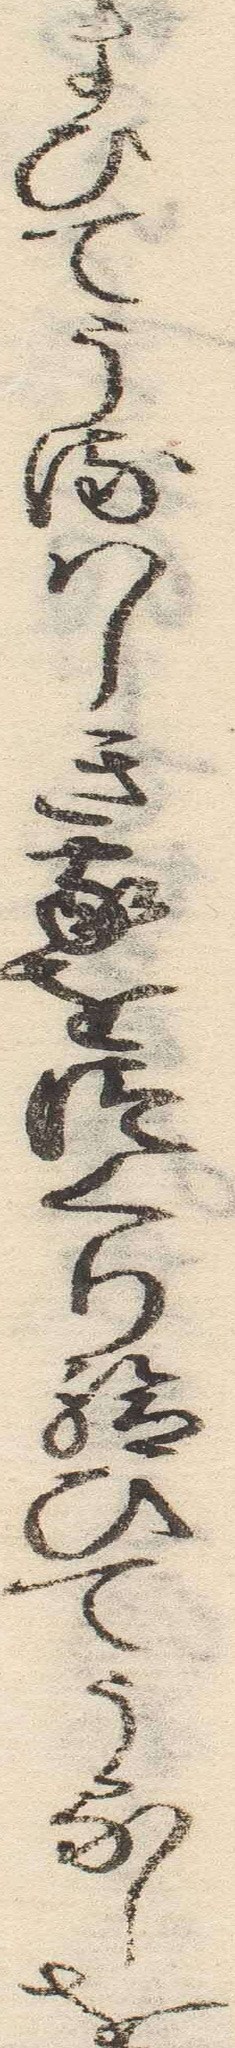まひてうるはしき家をつくり給ひてうるしを
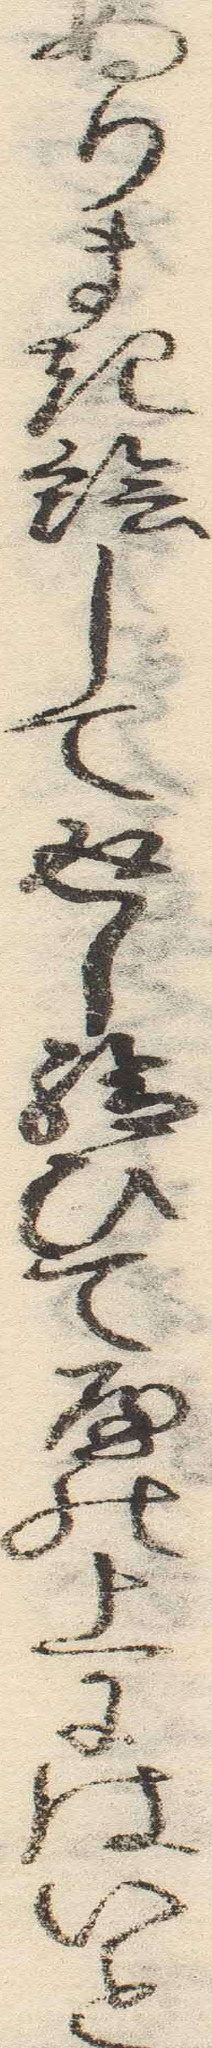ぬりまき絵して返し給ひて屋の上にはいと
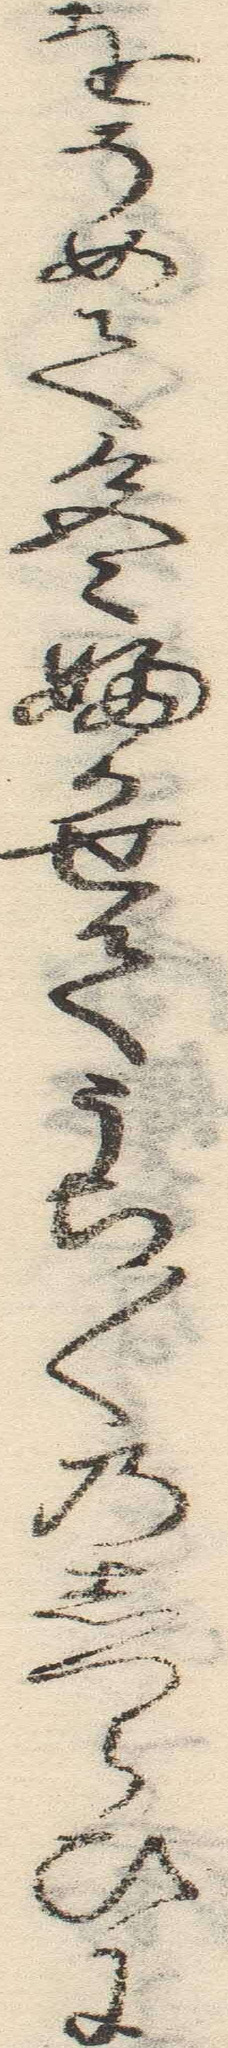をそめて色々ふかせてうち〳〵のしつらひに
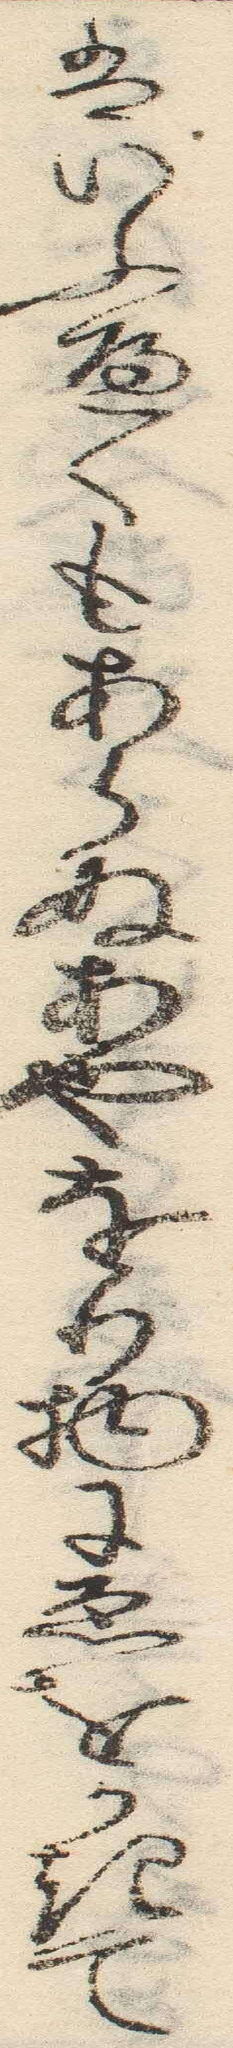はいふへくもあらぬあやをり物にゑをかきて
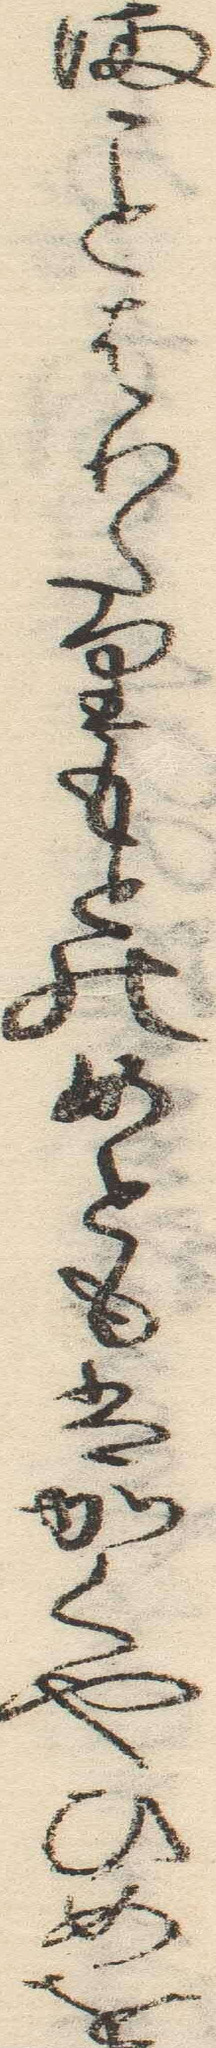まことはりたりもとのめともはかくやひめを
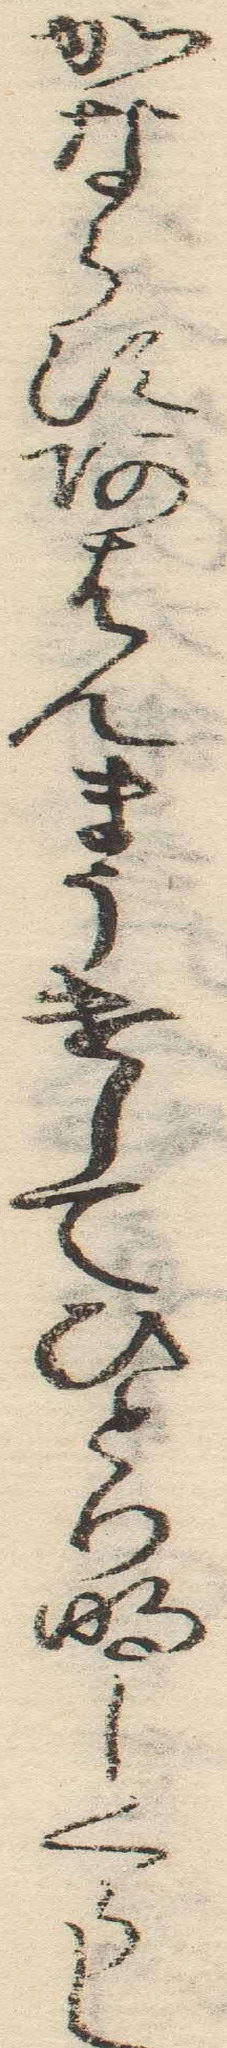かならすあはんまうけしてひとり明しくらし
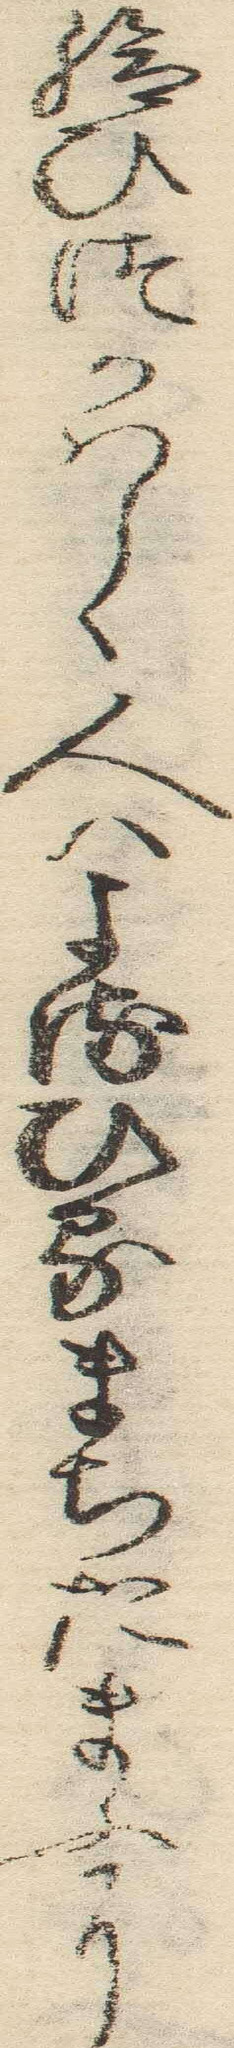給ひつかはしゝ人はよるひるまちたまふに
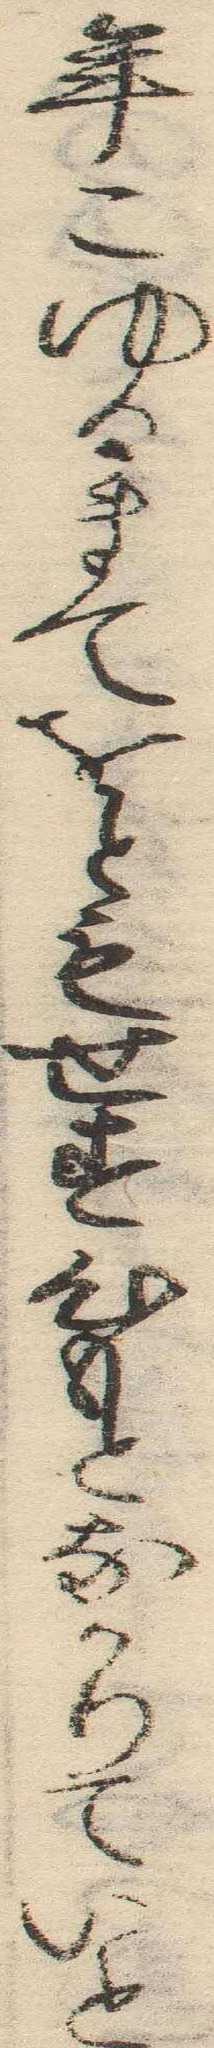年こゆるまてをともせす心もとなかりていと

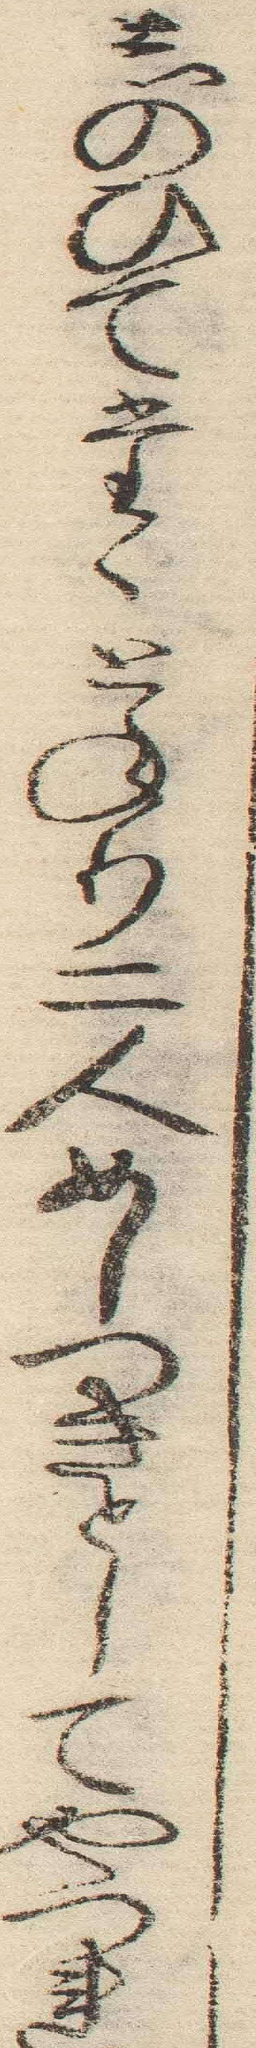しのひてたゝとねり二人めしつきとしてやつれ
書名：竹取物語
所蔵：東京学芸大学附属図書館 国文学研究資料館
